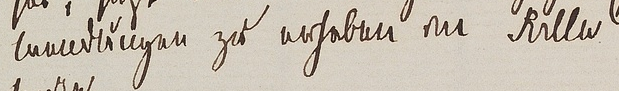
wendungen zu erheben im Falle
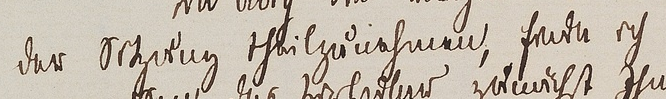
der Sitzung theilzunehmen, finde ich
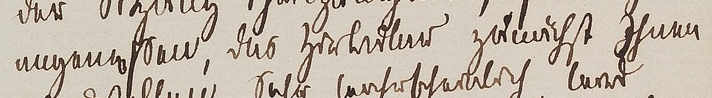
angemessen, das Zirkular zunächst Ihnen
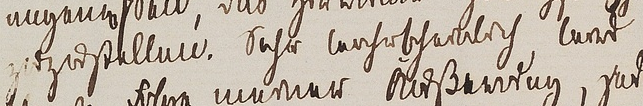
zuzustellen. Sehr wahrscheinlich wird
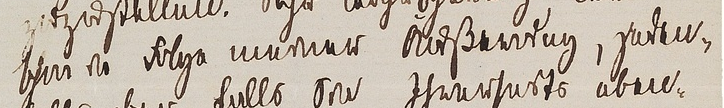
schon in Folge meiner Äußerung, jeden-
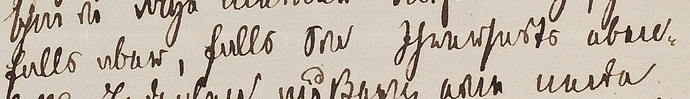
falls aber, falls Sie Ihrerseits eben-
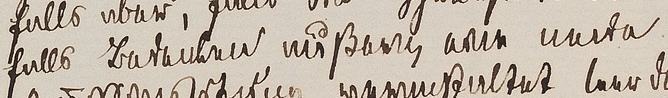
falls Bedenken äußern, eine neue
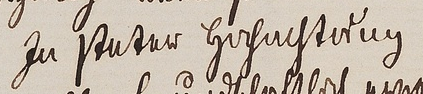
In steter Hochachtung
